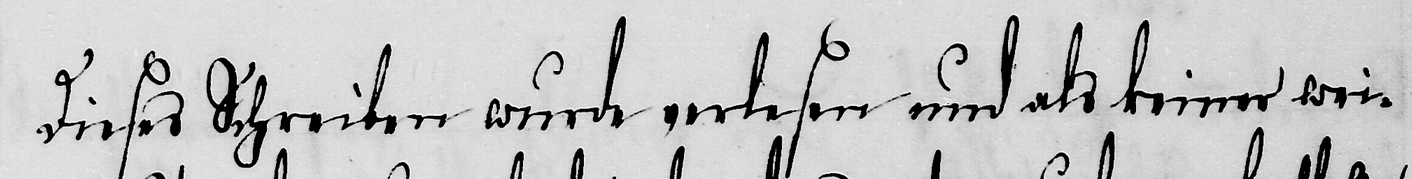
Dieses Schreiben wurde verlesen und als keiner wei¬
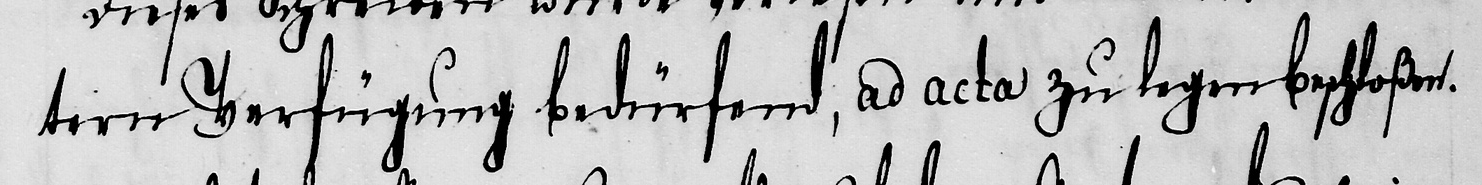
tern Verfügung bedürfend, ad acta zu legen beschloßen.
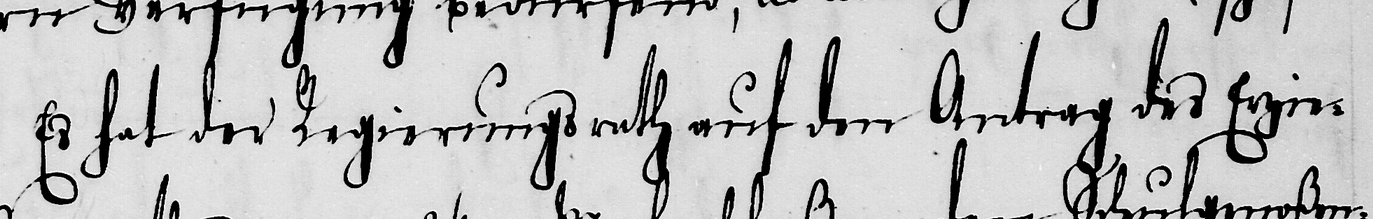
Es hat der Regierungsrath auf den Antrag des Erzie¬
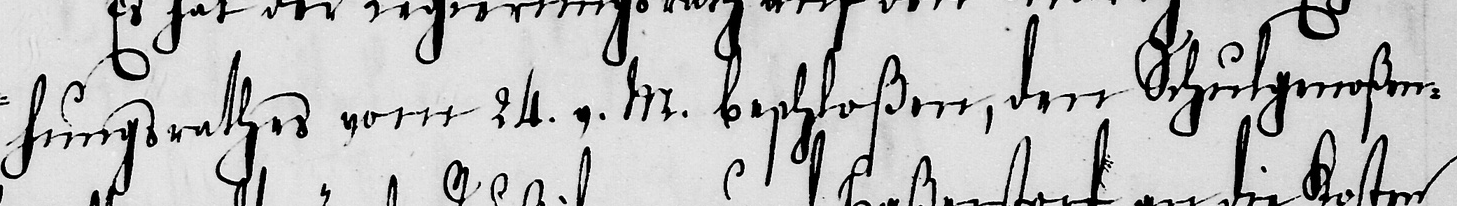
hungsrathes vom 24. v. M. beschloßen, den Schulgenoßen¬
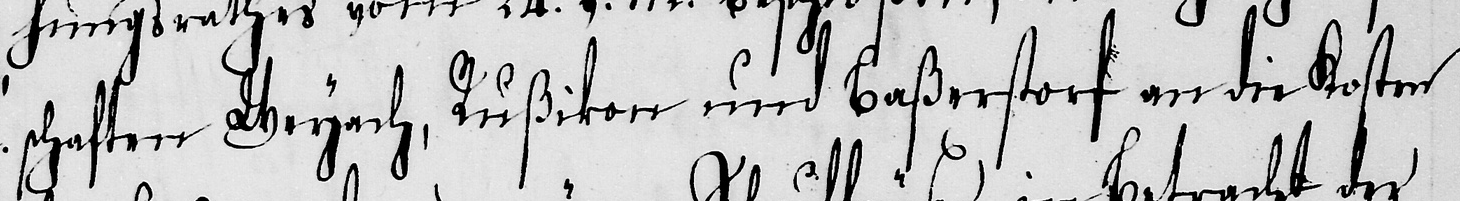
schaften Weyach, Rußikon und Baßerstorf an die Kosten
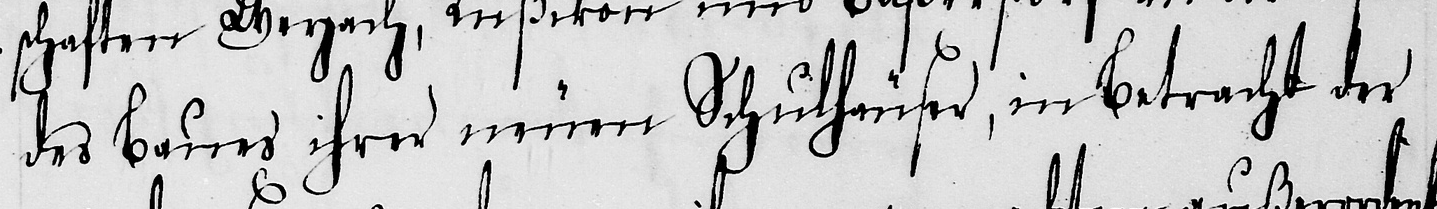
des Baues ihrer neuen Schulhäuser, in Betracht der
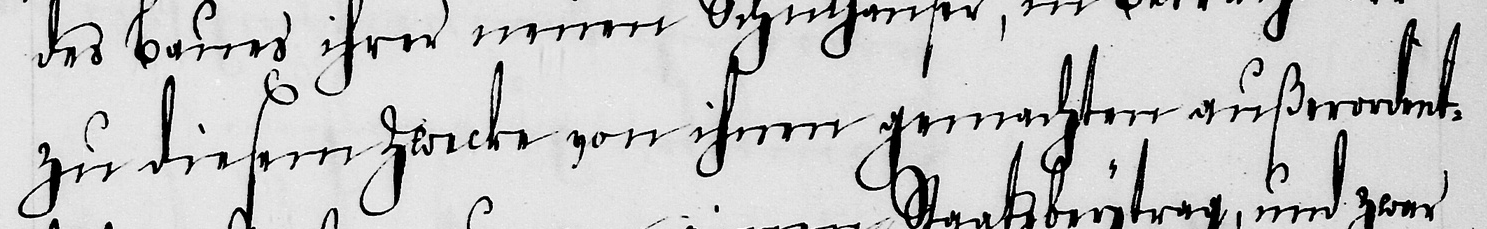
zu diesem Zwecke von ihnen gemachten außerordent¬
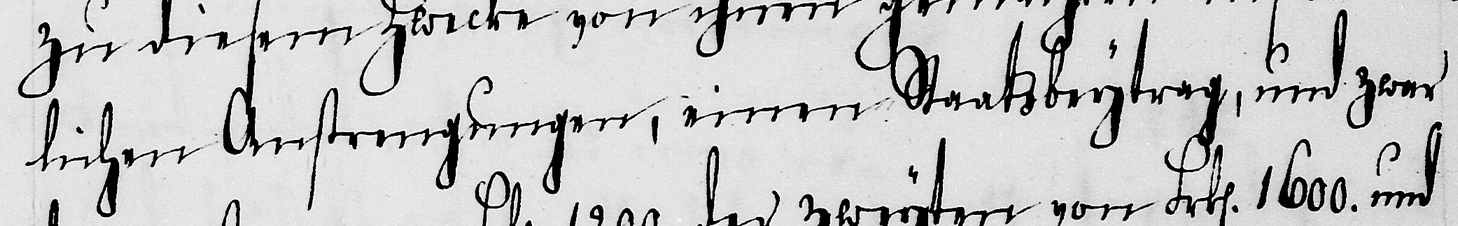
lichen Anstrengungen, einen Staatsbeytrag, und zwar
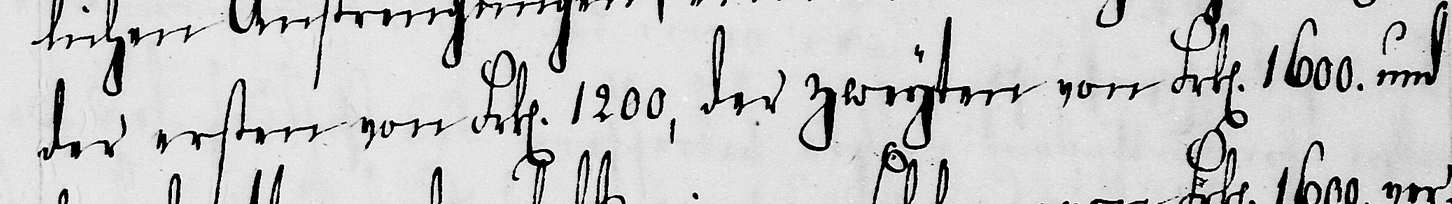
der ersten von Frk[en]. 1200, der zweyten von Frk[en]. 1600. und
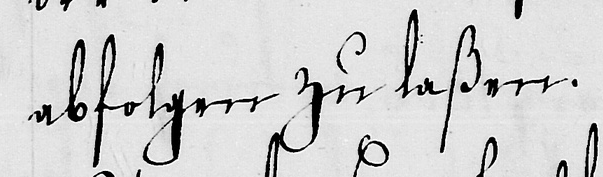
abfolgen zu laßen.
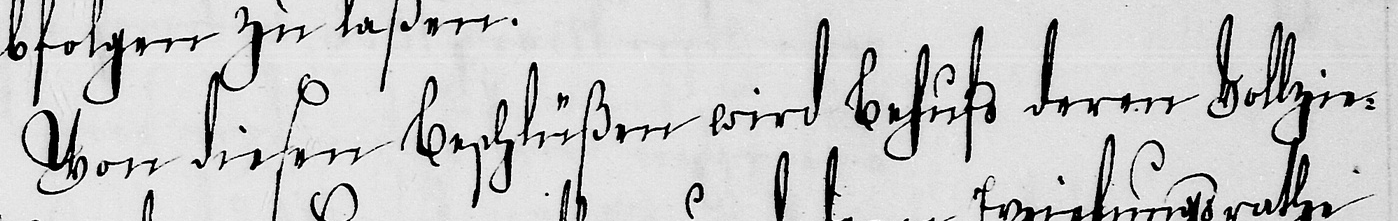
Von diesen Beschlüßen wird Behufs deren Vollzie¬
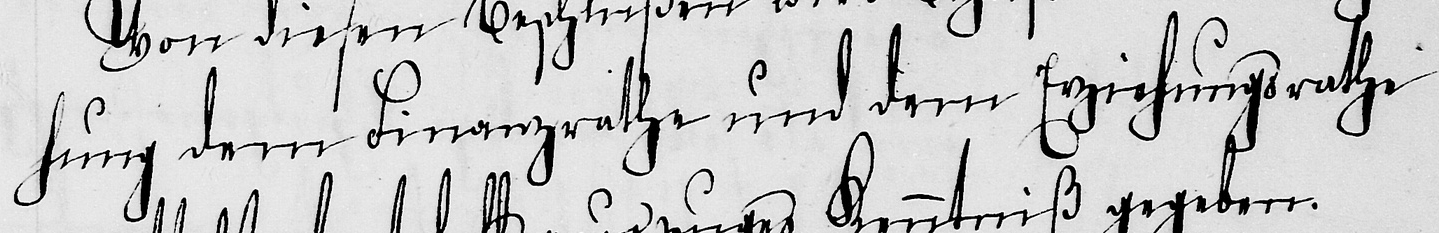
hung dem Finanzrathe und dem Erziehungsrathe
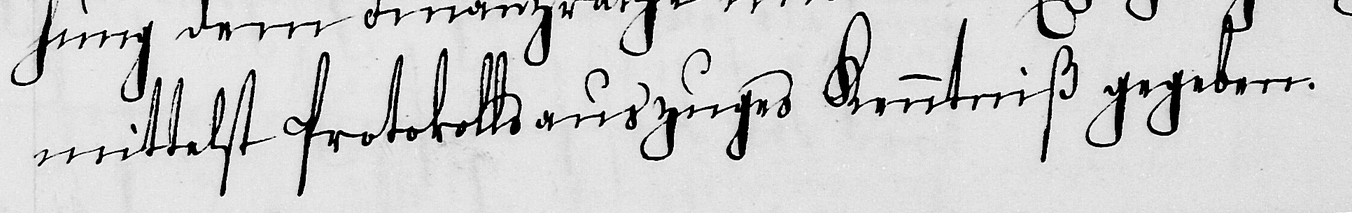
mittelst Protokollsauszuges Kenntniß gegeben.
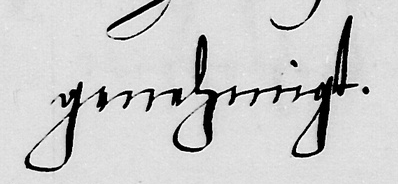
genehmigt.
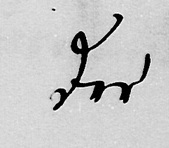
ver¬
